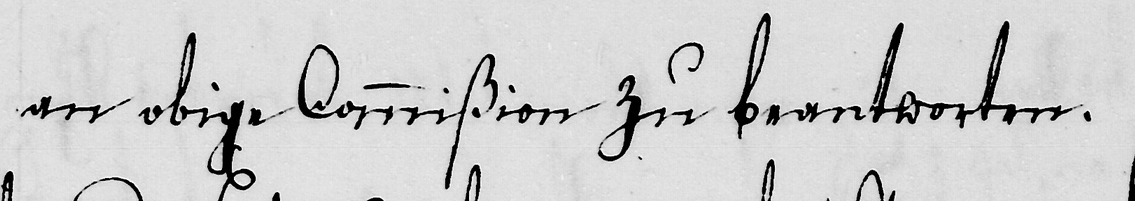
an obige Commißion zu beantworten.
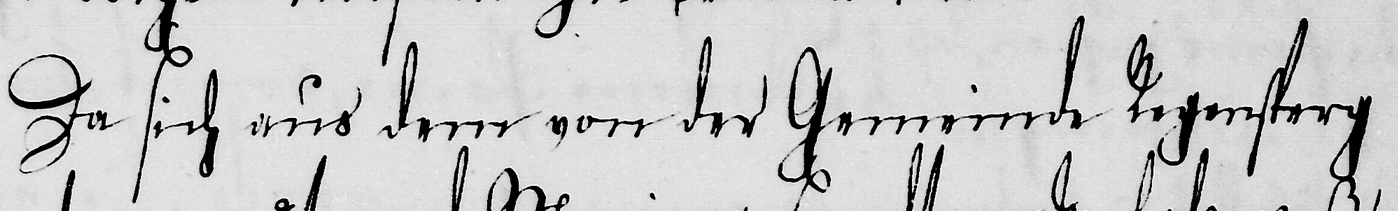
Da sich aus dem von der Gemeinde Regensperg
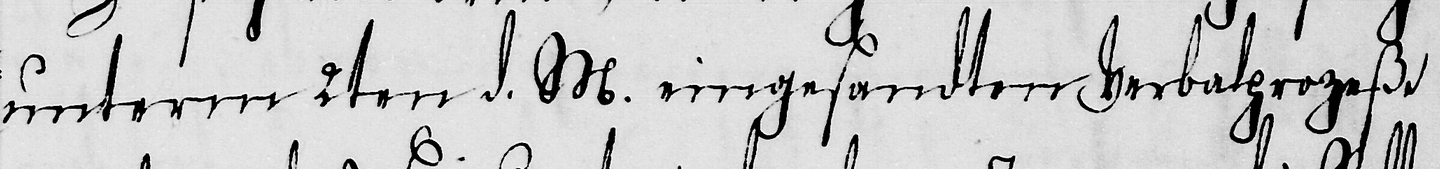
unterm 2ten d. M. eingesandten Verbalprozeße
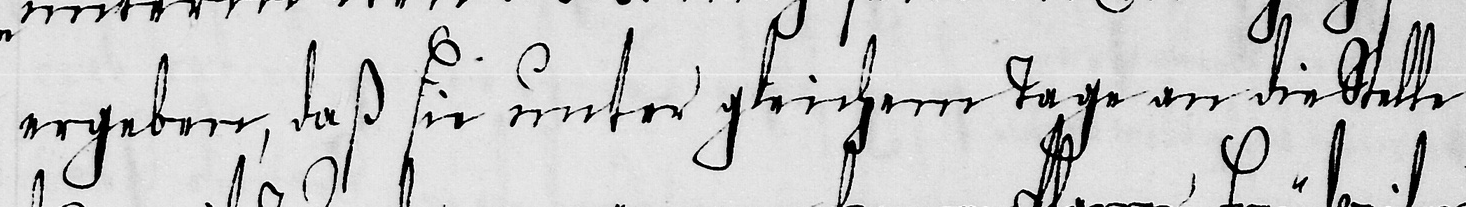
ergeben, daß sie unter gleichem Tage an die Stelle
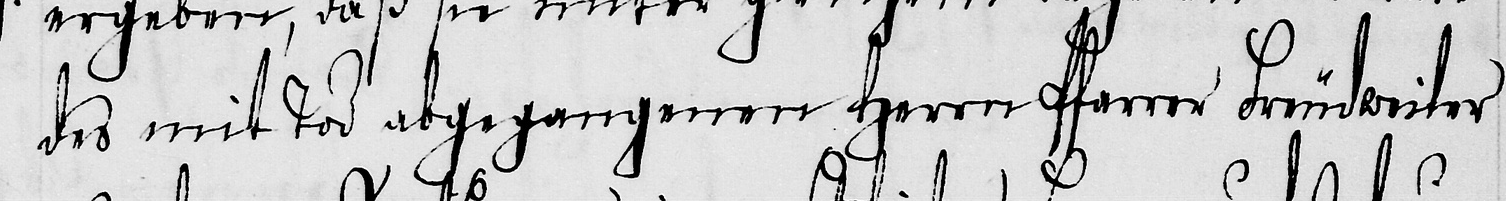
des mit Tod abgegangenen Herrn Pfarrer Freudweiler
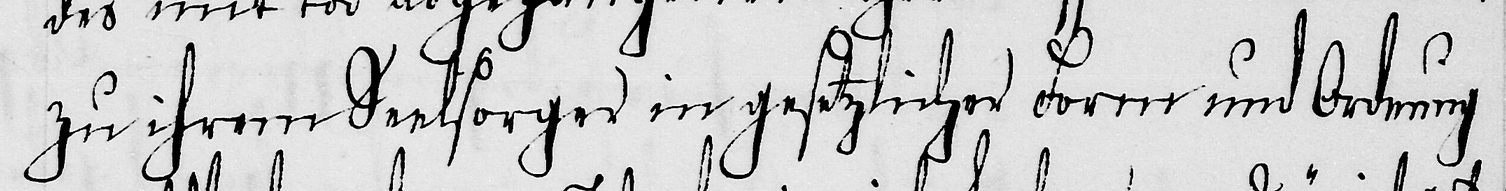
zu ihrem Seelsorger in gesetzlicher Form und Ordnung
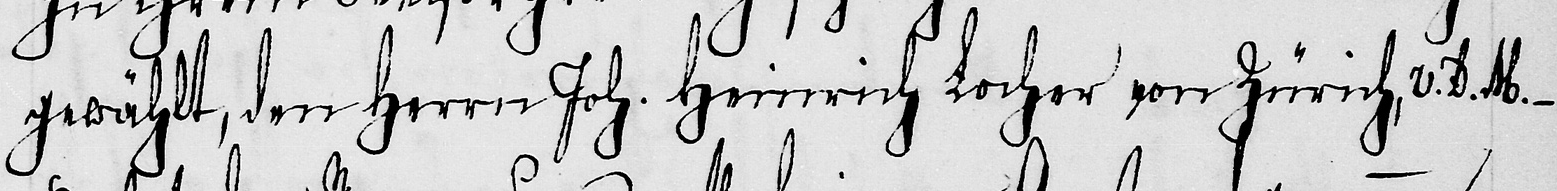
gewählt, den Herrn Joh. Heinrich Locher von Zürich, V. D.
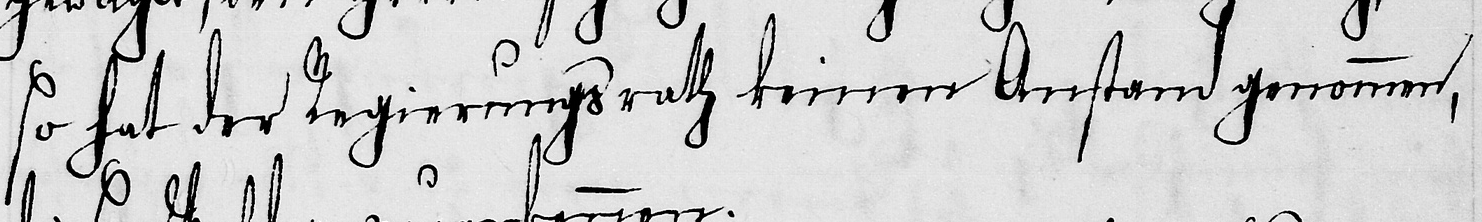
so hat der Regierungsrath keinen Anstand genommen,
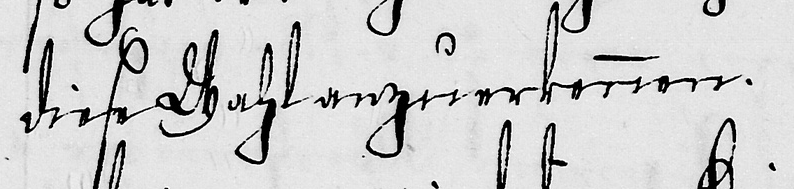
diese Wahl anzuerkennen.
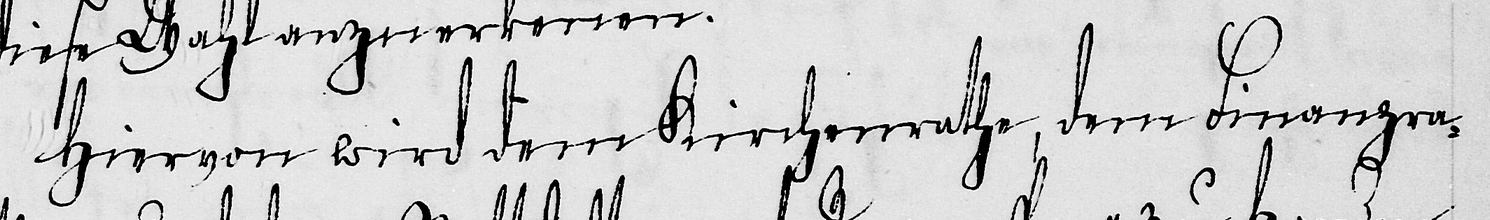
Hiervon wird dem Kirchenrathe, dem Finanzra¬
